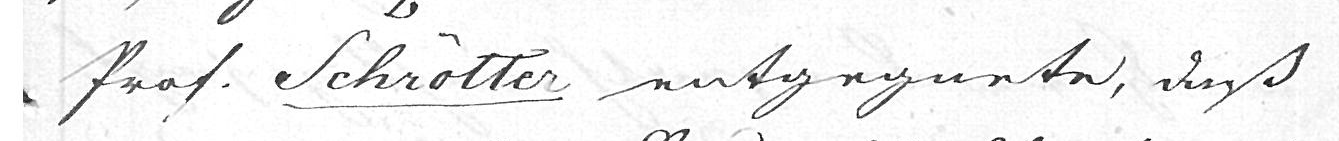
Prof. Schrötter entgegnete, daß
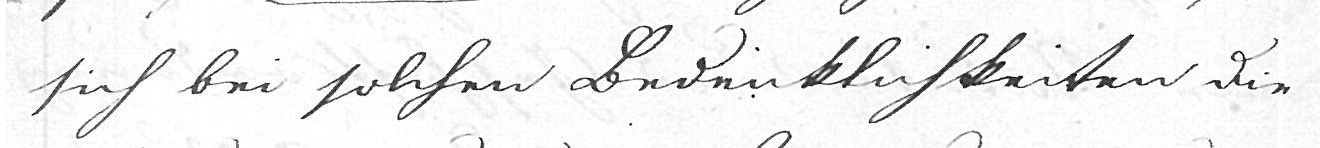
sich bei solchen Bederklichkeiten die
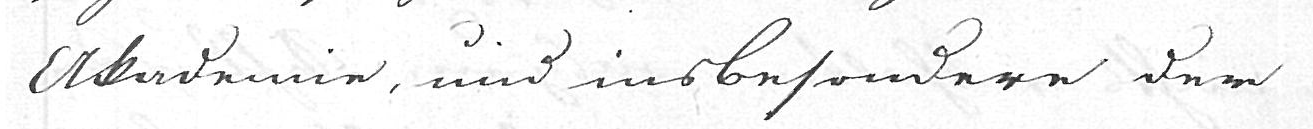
Akademie, und insbesondere der
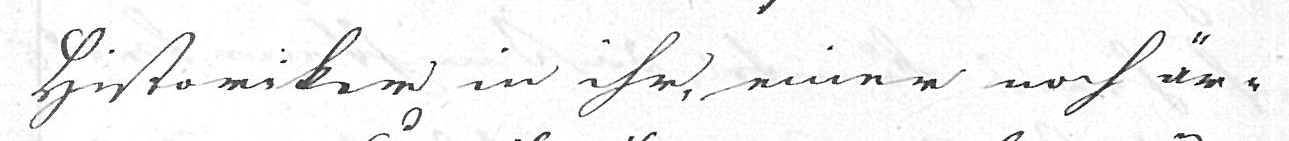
Historiker in ihr, einer noch är-
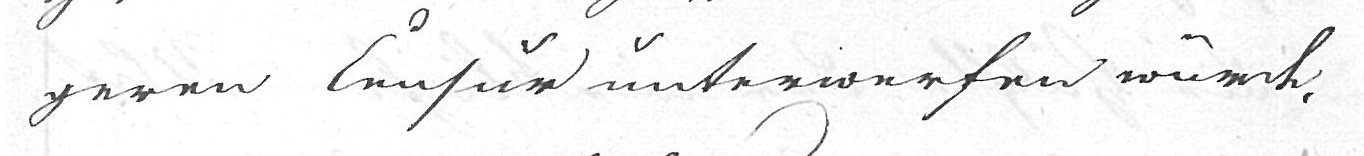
geren Censur unterwerfen würde,
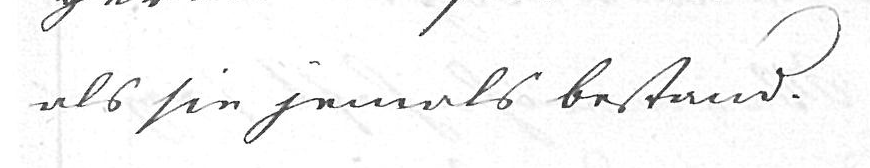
als sie jemals bestand.
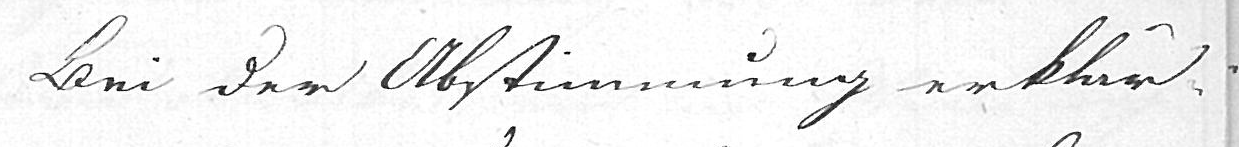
Bei der Abstimmung erklär-
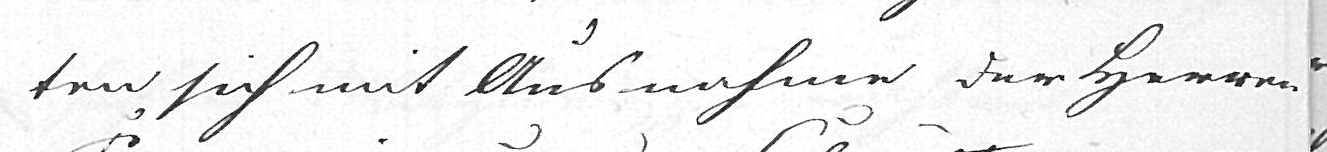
ten sich mit Ausnahme der Herren
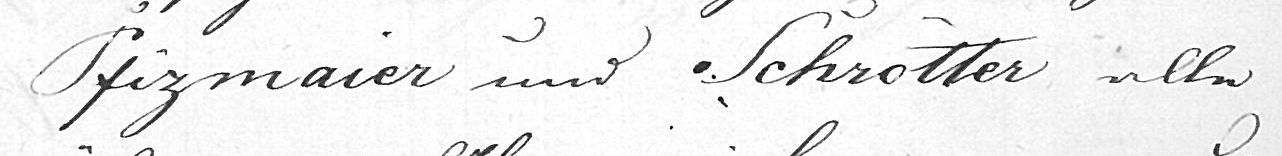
Pfizmaier und Schrötter, alle
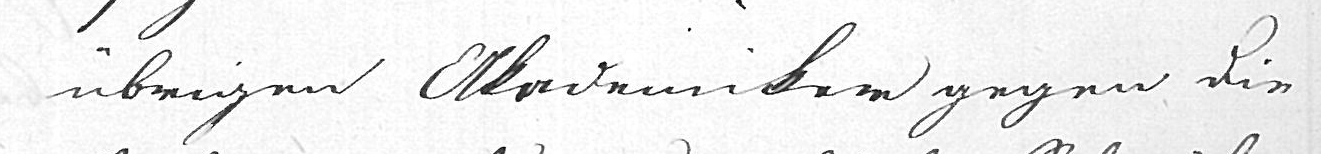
übrigen Akademiker gegen die
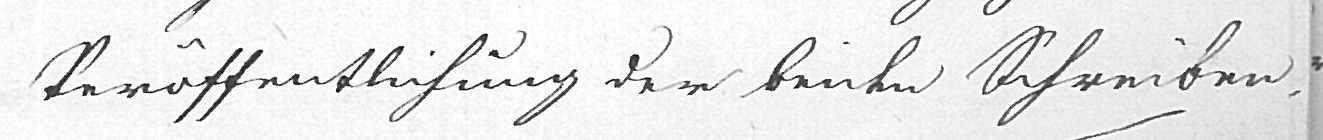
Veröffentlichung der beiden Schreiben.
